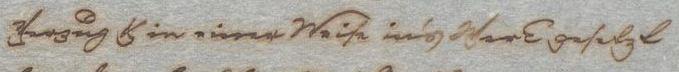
Verzug & in einer Weise in's Werk gesetzt
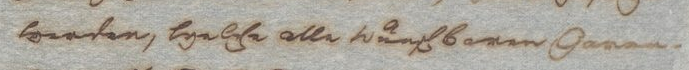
werden, welche alle wünschbaren Garan-
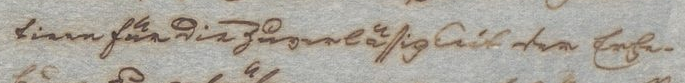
tieen für die Zuverlässigkeit der Erhe-
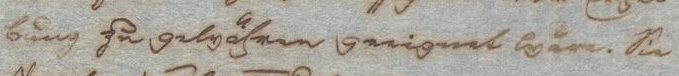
bung zu gewähren geeignet wäre. Sie
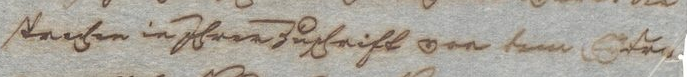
sprechen in Ihrer Zuschrift von dem Hydro-
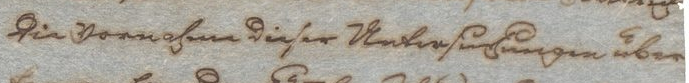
die Vornahme dieser Untersuchungen über-
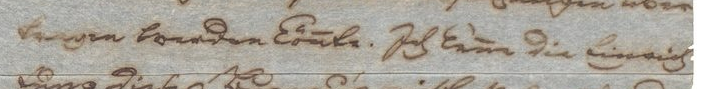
tragen werden könnte. Ich kenne die Einrich-
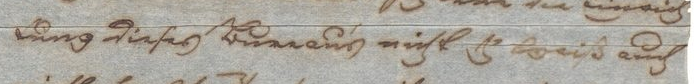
tung dieses Bureau's nicht & weiß auch
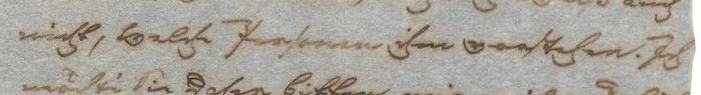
nicht, welche Personen ihm vorstehen. Ich
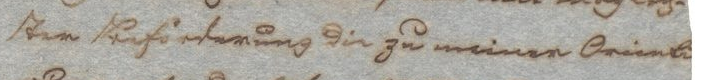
ster Beförderung die zu meiner Orienti-
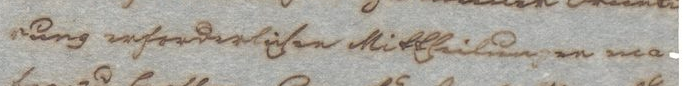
rung erforderlichen Mittheilungen ma-
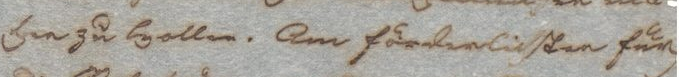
chen zu wollen. Am förderlichsten für
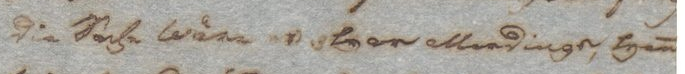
die Sache wäre es zwar allerdings, wenn
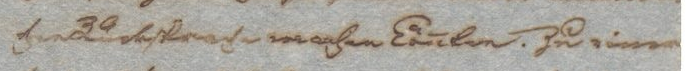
chen Rücksprache machen könnten. Zu einer
